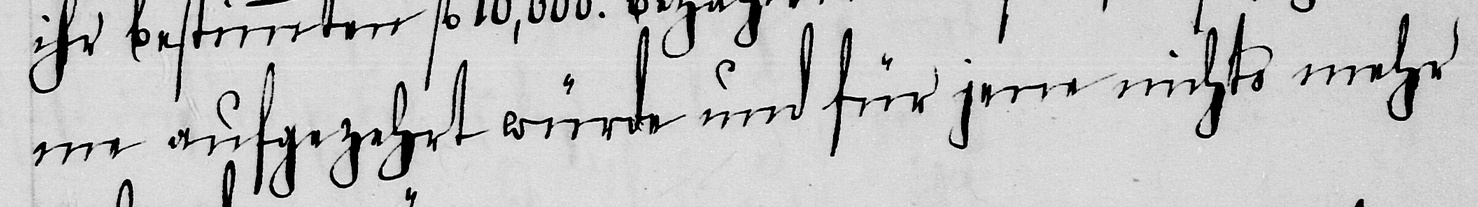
me aufgezehrt würde und für jene nichts mehr
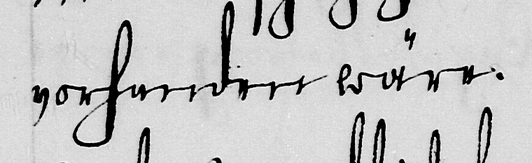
vorhanden wäre.
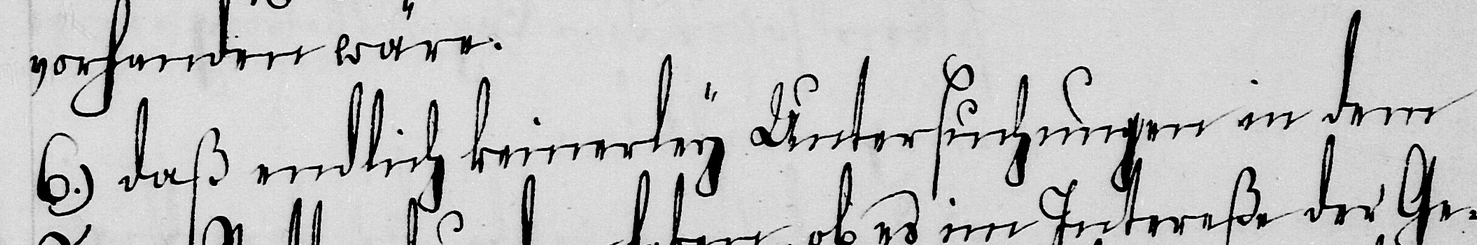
6.) daß endlich keinerley Untersuchungen in dem
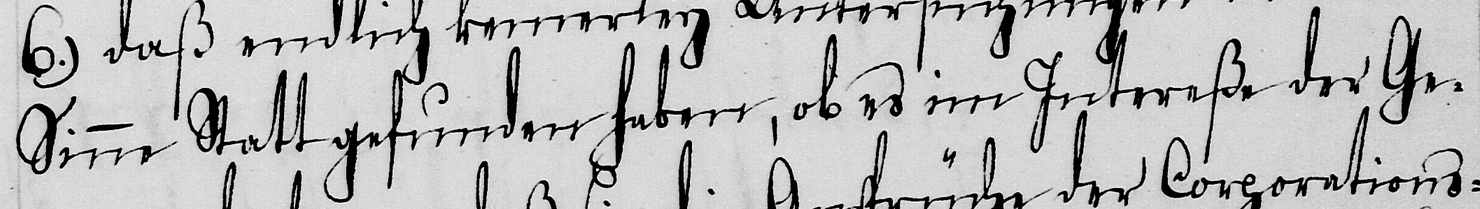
Sinne Statt gefunden haben, ob es im Intereße der Ge¬
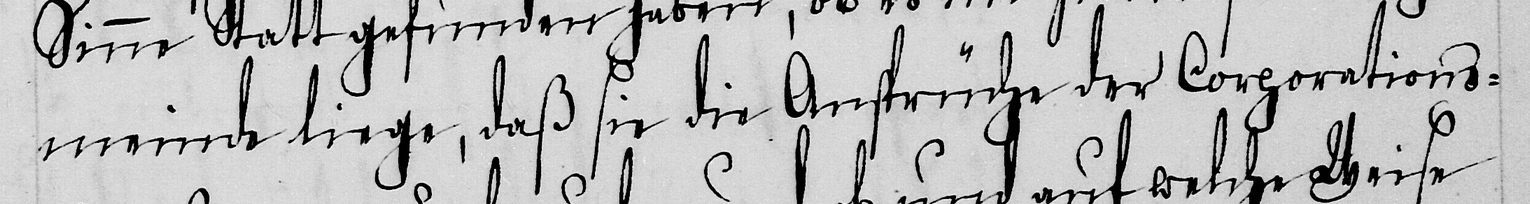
meinde liege, daß sie die Ansprüche der Corporations¬
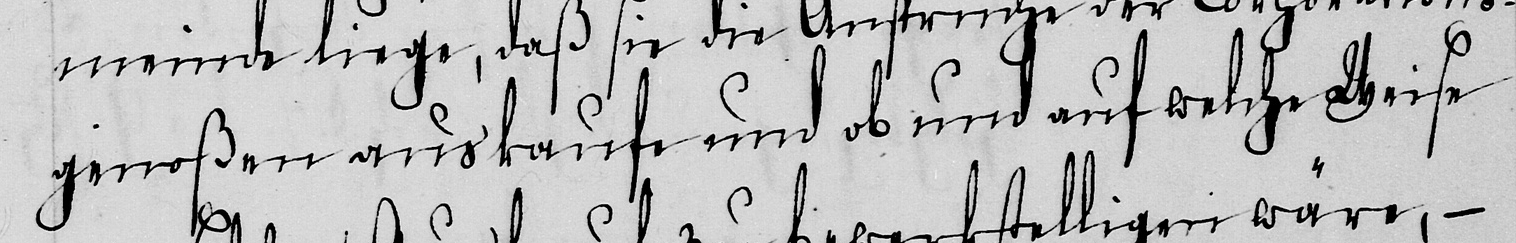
genoßen auskaufe und ob und auf welche Weise
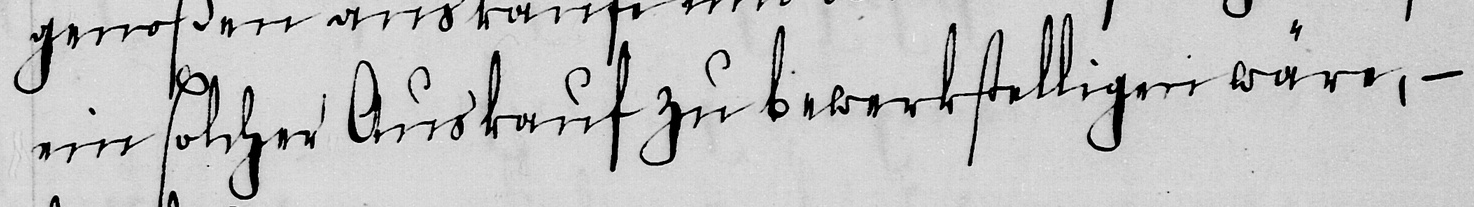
ein solcher Auskauf zu bewerkstelligen wäre, –
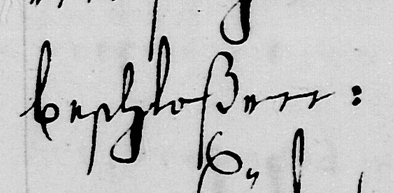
beschloßen:
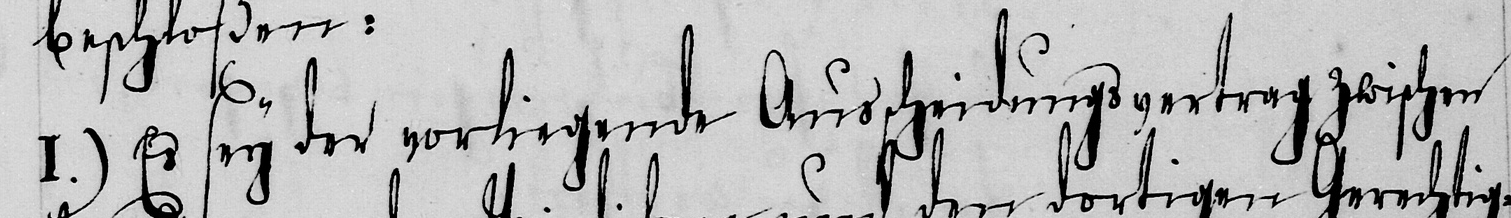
I.) Es sey der vorliegende Ausscheidungsvertrag zwischen
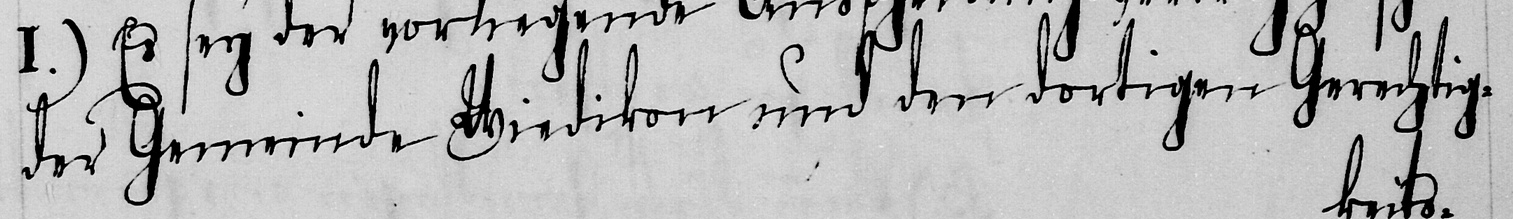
der Gemeinde Wiedikon und den dortigen Gerechtig-
